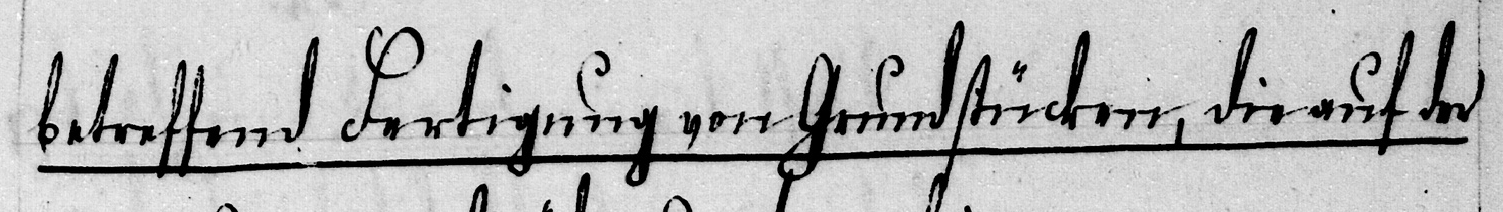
betreffend Fertigung von Grundstücken, die auf der
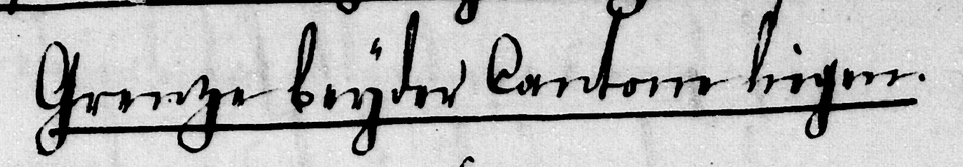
Grenze beyder Cantone liegen.
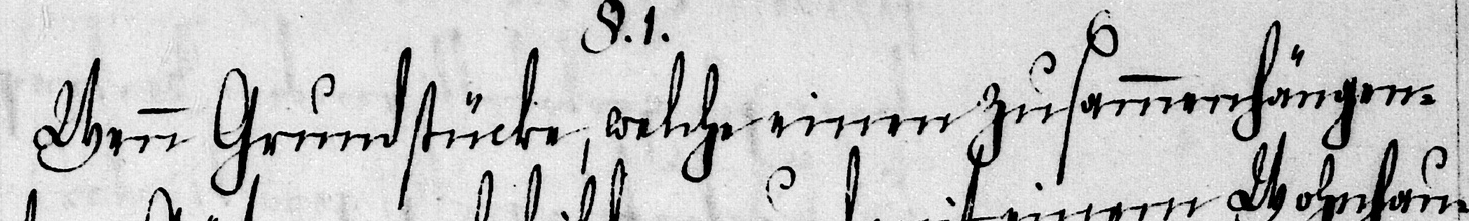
Wenn Grundstücke, welche einen zusammenhängen¬
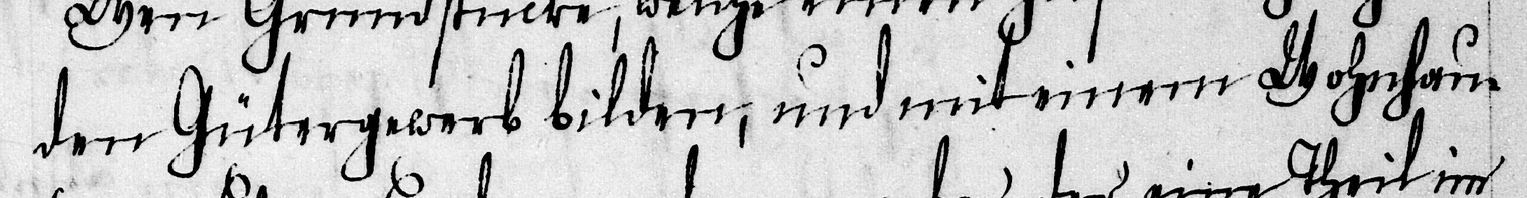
den Gütergewerb bilden, und mit einem Wohnhau¬
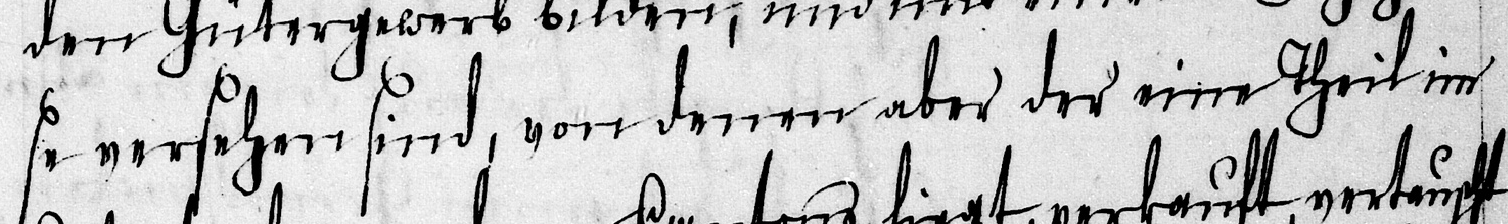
se versehen sind, von denen aber der eine Theil im
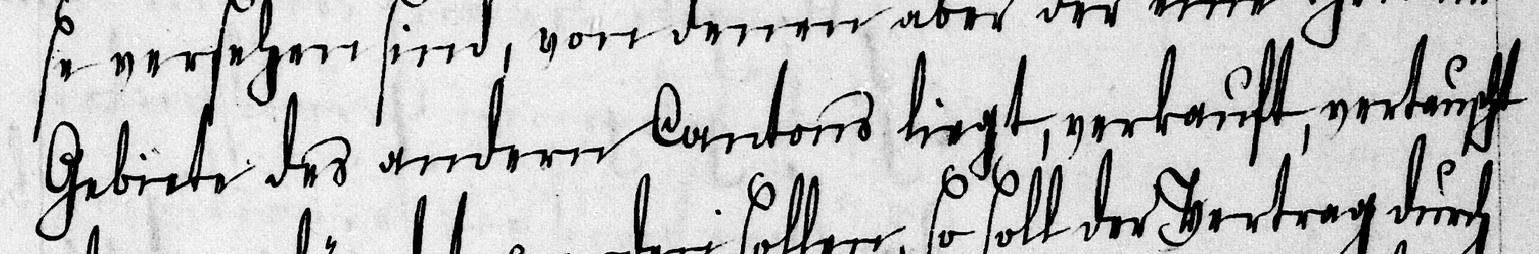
Gebiete des andern Cantons liegt, verkauft, vertausc¬
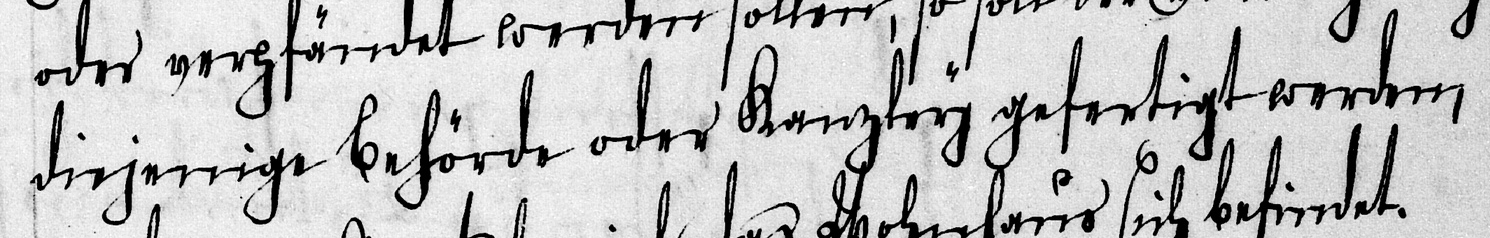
diejenige Behörde oder Kanzley gefertigt werden,
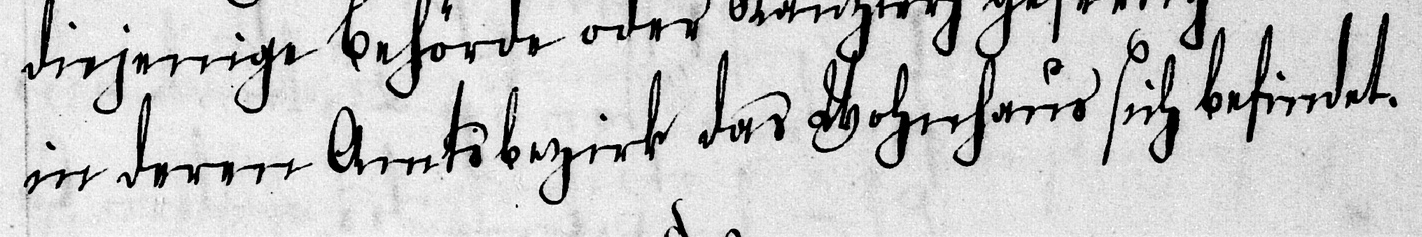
in deren Amtsbezirk das Wohnhaus sich befindet.
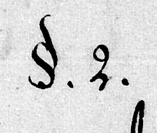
§. 2.
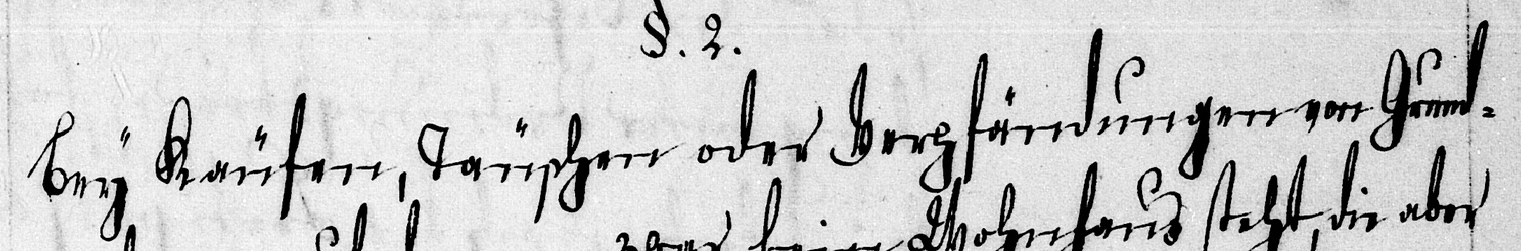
Bey Käufen, Täuschen oder Verpfändungen von Grund¬
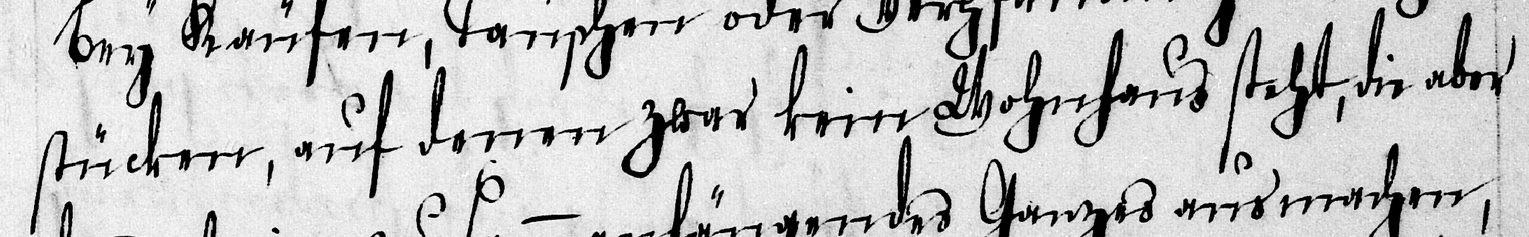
stücken, auf denen zwar kein Wohnhaus steht, die aber
